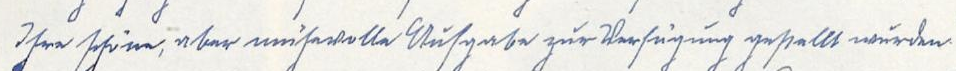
Ihre schöne, aber mühevolle Aufgaben zur Verfügung gestellt wurden.
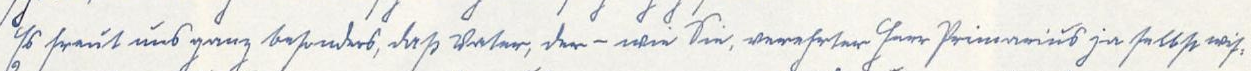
Es freut uns ganz besonders, dass Vater, der-wie Sie, verehrter Herr Primarius ja selbst wis-
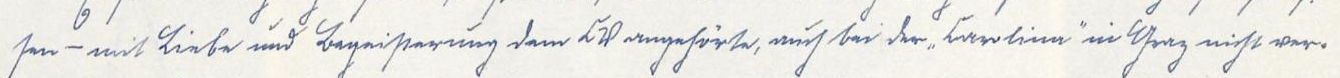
sen-mit Liebe und Begeisterung dem CV angehörte, auch bei der „Carolina2 in Graz nicht ver-
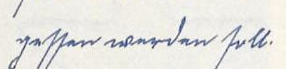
gessen werden soll.
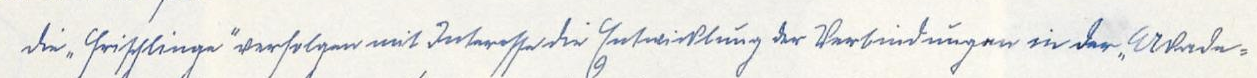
Die „Frischlinge“ verfolgen mit Interesse die Entwicklung der Verbindungen in der „Akade-
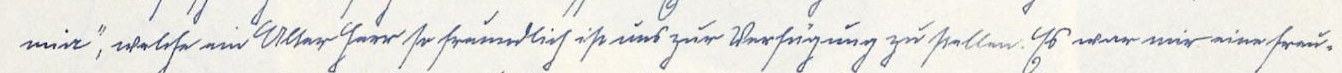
mia“, der welche ein Alter Herr so freundlich ist uns zur Verfügung zu stellen. Es war mir eine freu-
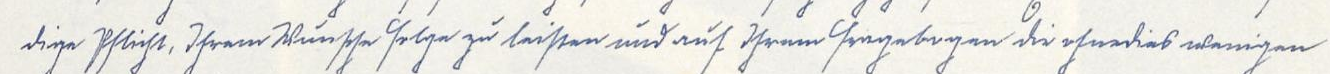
dige Pflicht, Ihrem Wunsche Folge zu leisten und auf Ihrem Fragebogen die ohnedies wenigen
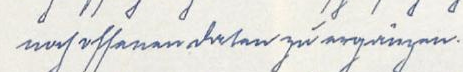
noch offenen Daten zu ergänzen.
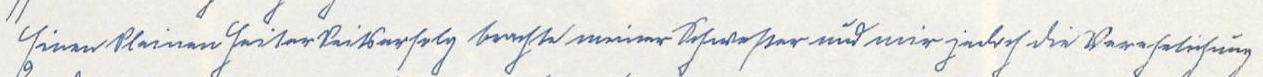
Einen kleinen Heiterkeitserfolg brachte meiner Schwester und mir jedoch die Verehelichung
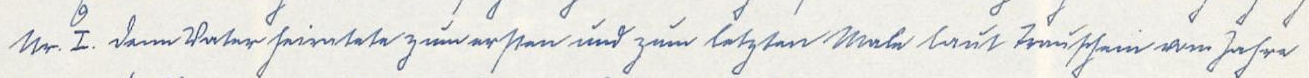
Nr. I. Denn Vater heiratete zum ersten und zum letzten Male laut Trauschein vom Jahre
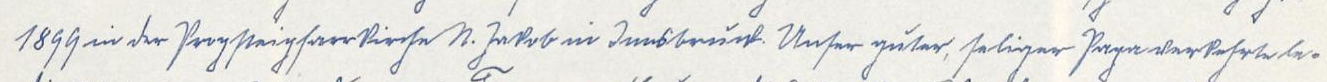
1899 in der Propsteipfarrkirche St. Jakob in Innsbruck. Unser guter, seliger Papa verkehrte le-
